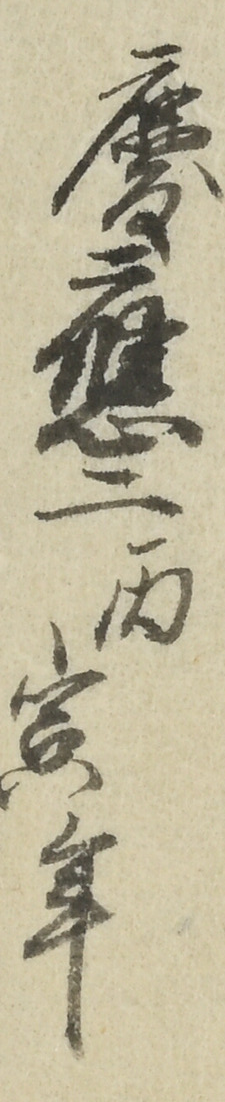慶応二丙寅年

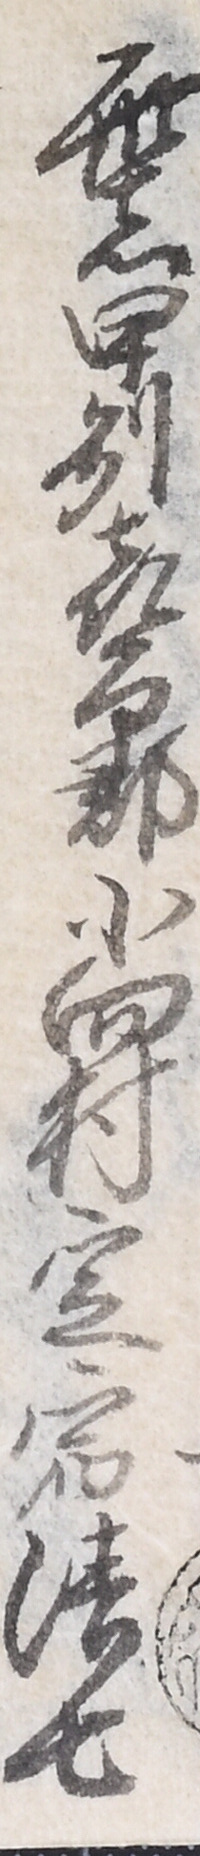此者甲州都留郡小向村定宿清七
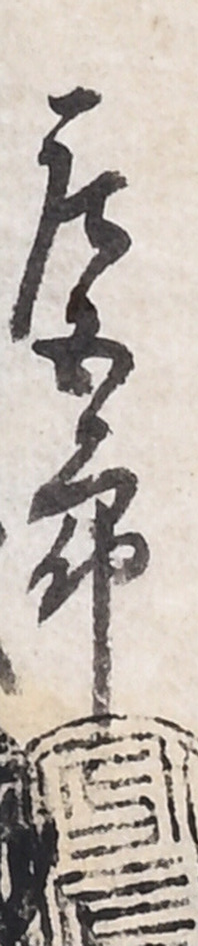庄五郎
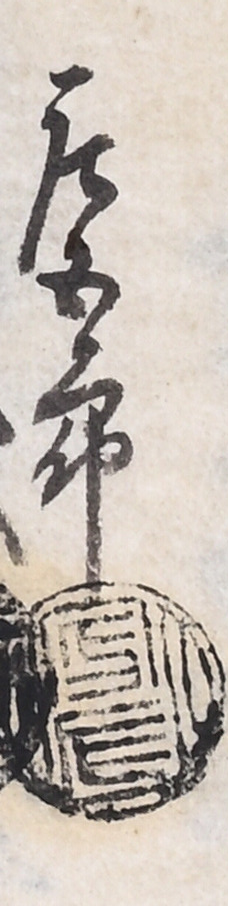庄五郎
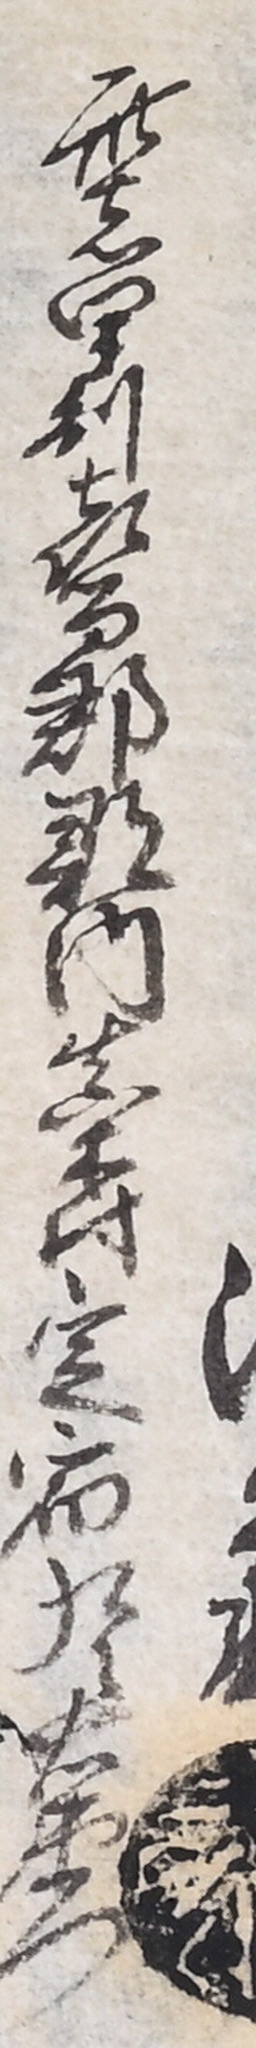此者甲州都留郡郡内真木村定宿九郎右衛門
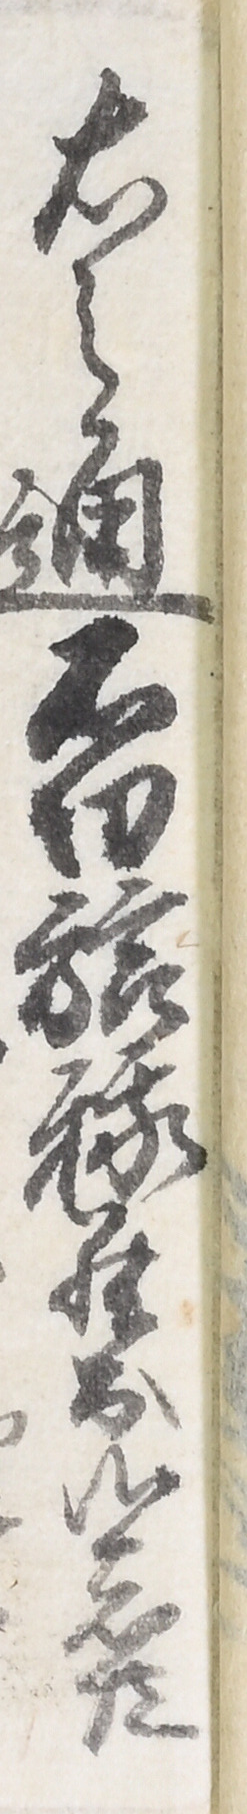右之通石切旅稼罷出候者共
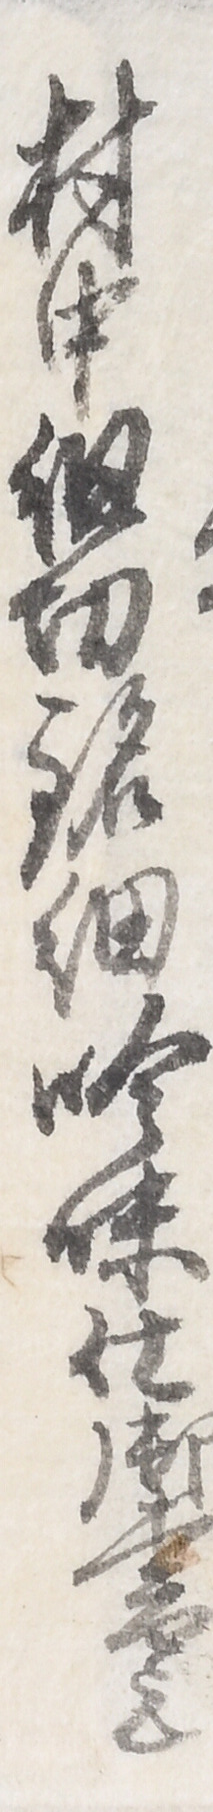村中組切銘細吟味仕御書
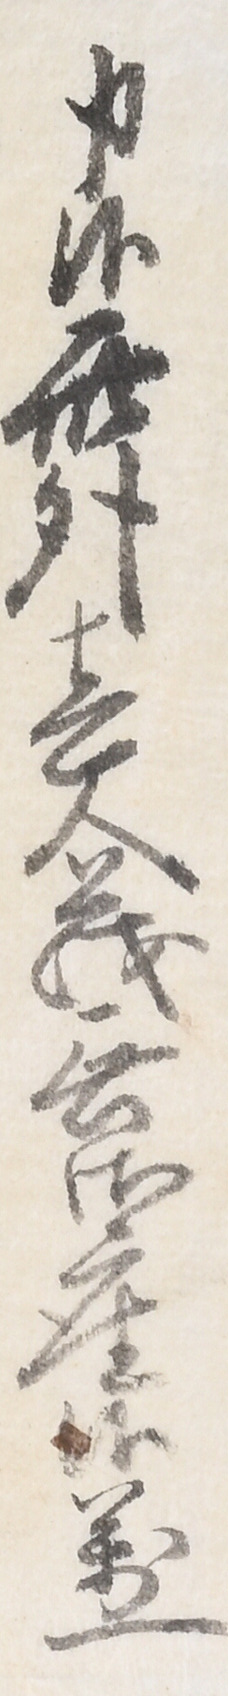申候此外壱人茂無御座候万一
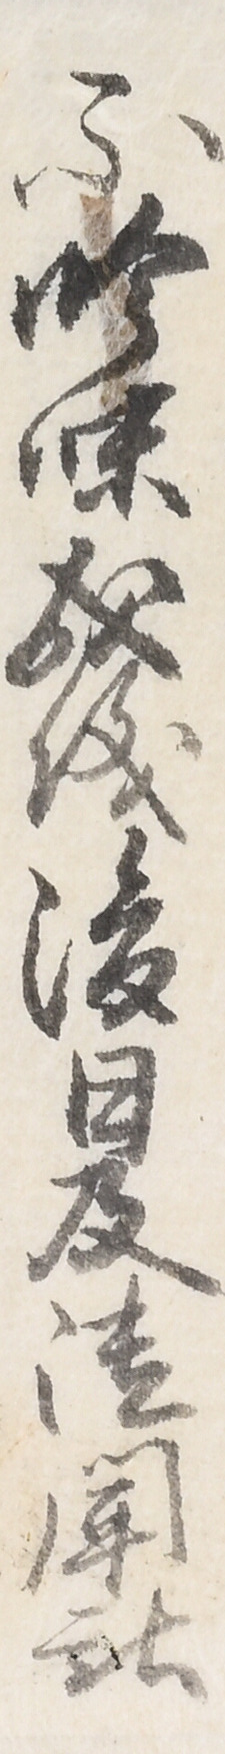不吟味成儀後日及御聞被
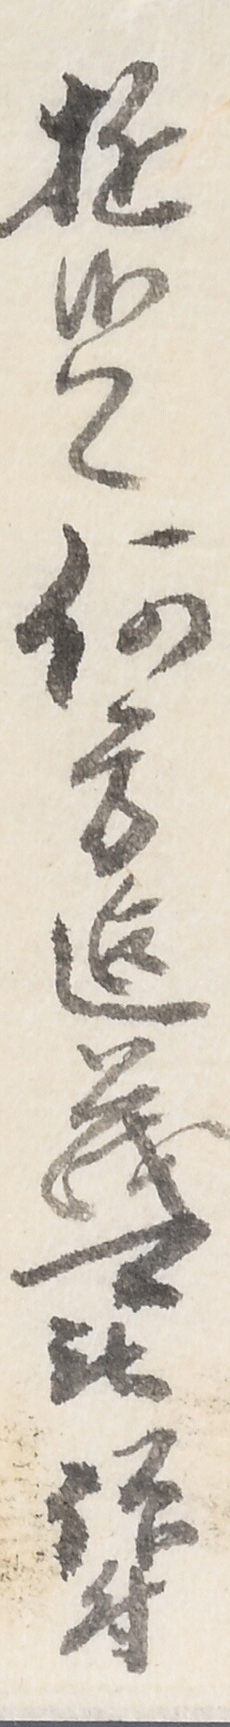遊候ハヽ何方迄茂可被仰付
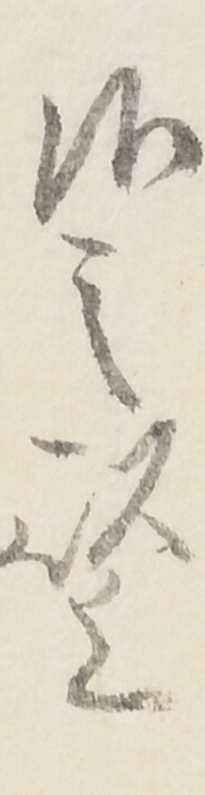候之以上
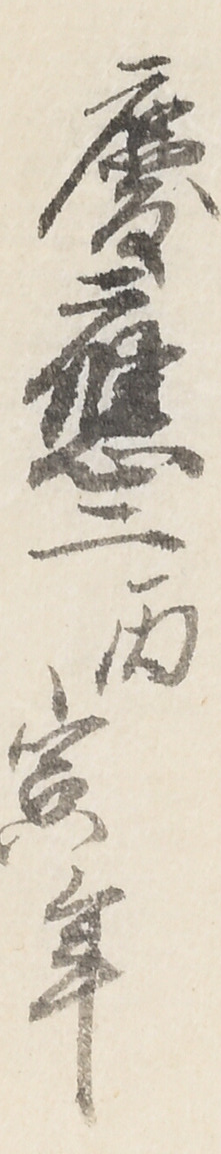慶応二丙寅年
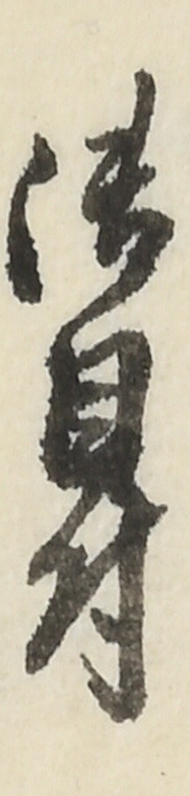御目付
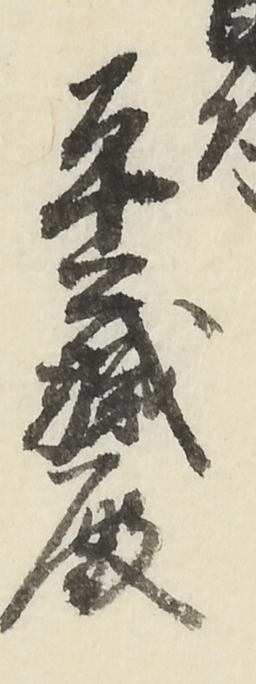平蔵殿
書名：慶應二丙寅年二月他國出石切名前書上帳
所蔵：伊那市立高遠町図書館・合同会社AMANE
